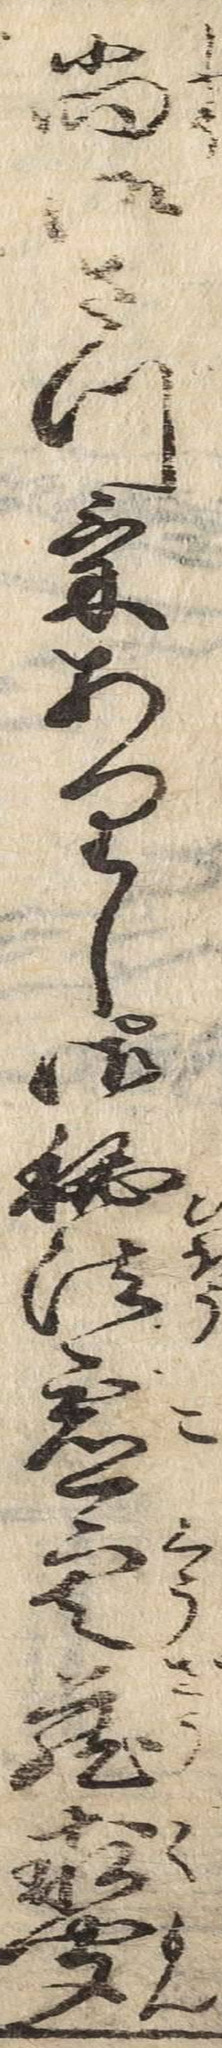尚御さづけありし。御秘法虚空蔵求聞
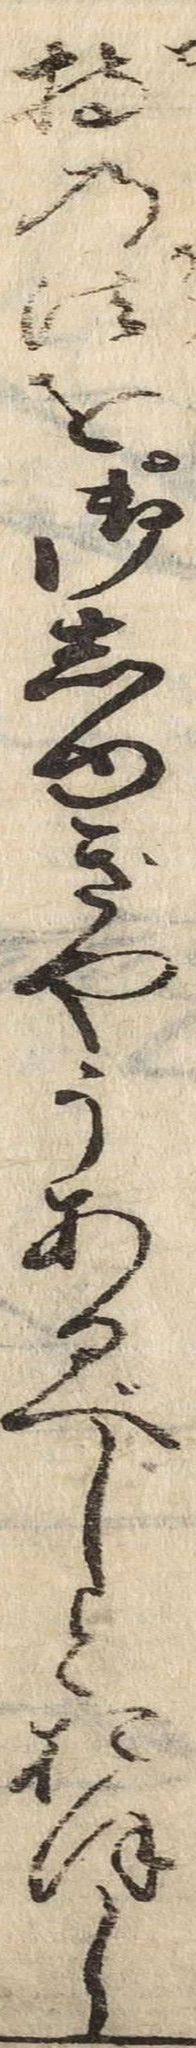持の法を。御しゆぎやうあるべしとおほし
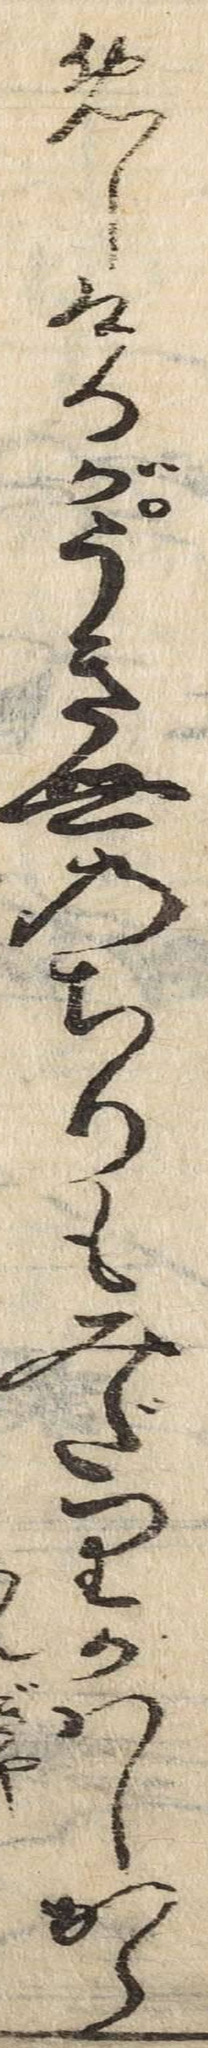めしけるが。うき世のちりもみだりかはしから
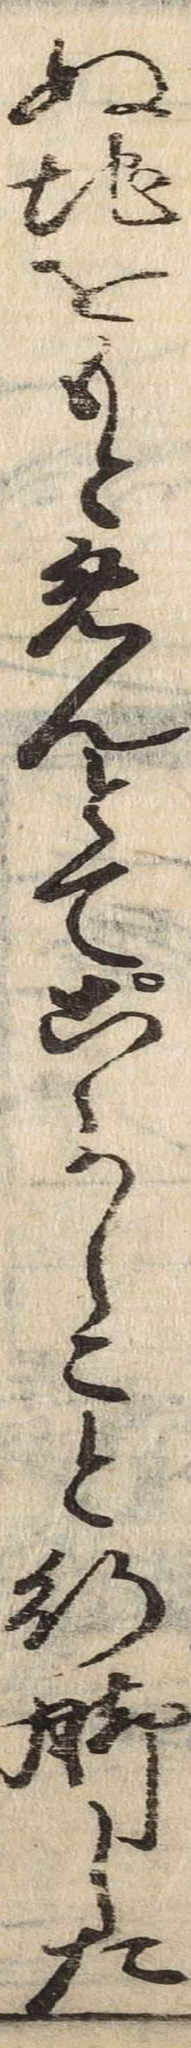ぬ地をもとめんとて。こゝかしこと行脚した
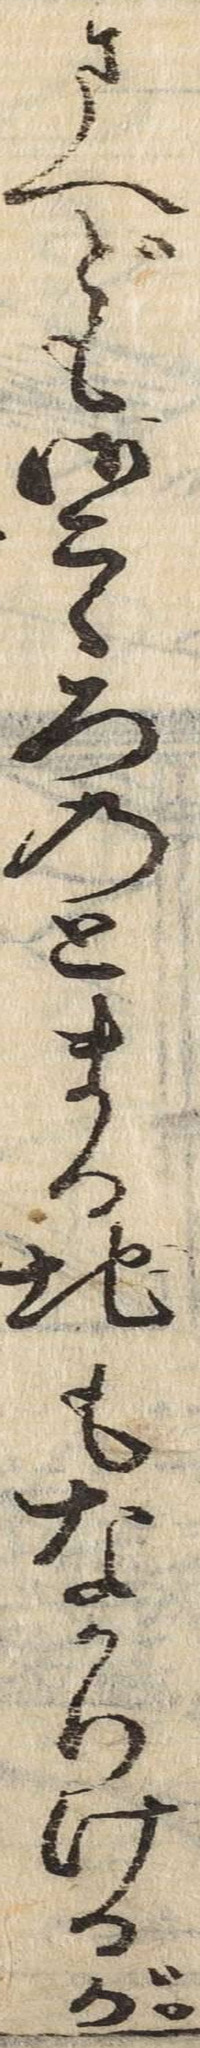まへども御こゝろのとまる地もなかりけるが。
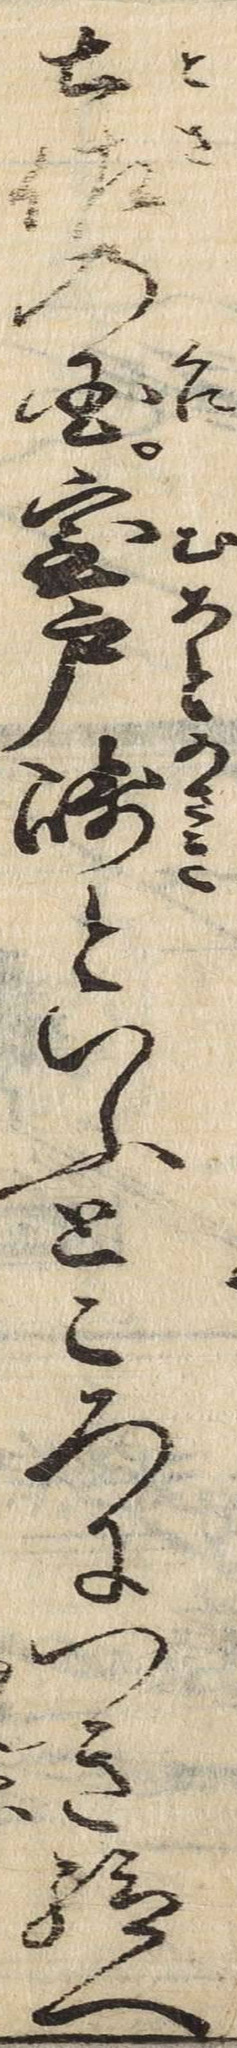土佐の国。室戸崎といふところにつき給へ
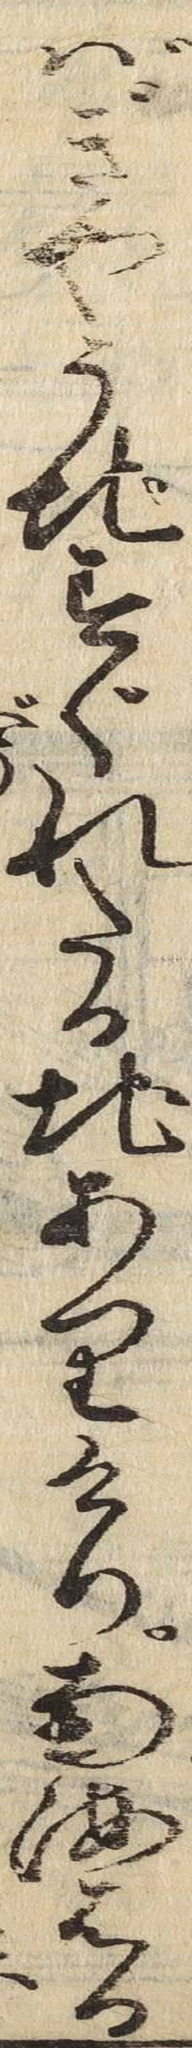ば。きやうちすぐれたる地ありけり。南海はる
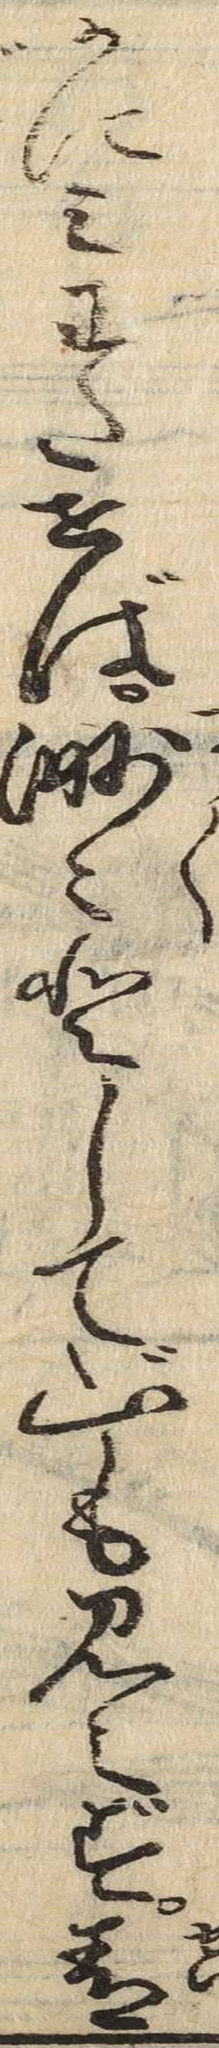かにみわたせば。渺々として。山も見えず。青
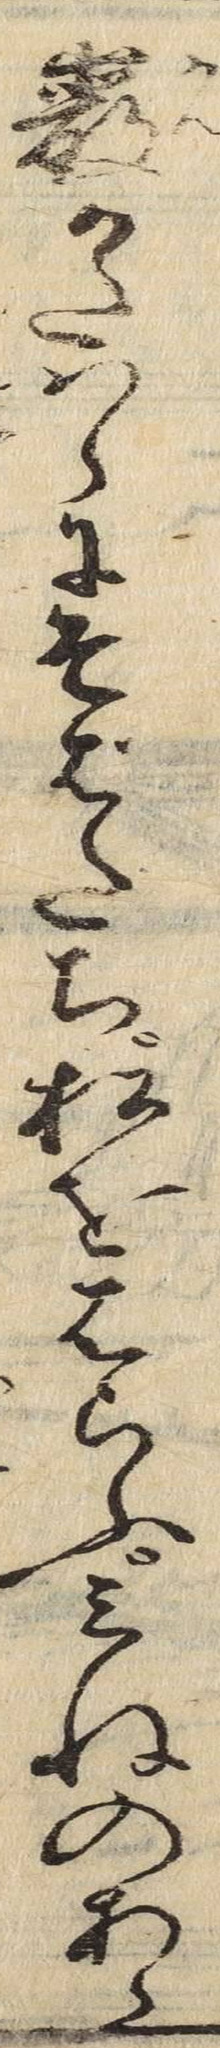巌かたはらにそはたち。松をはらふ。みねのあら
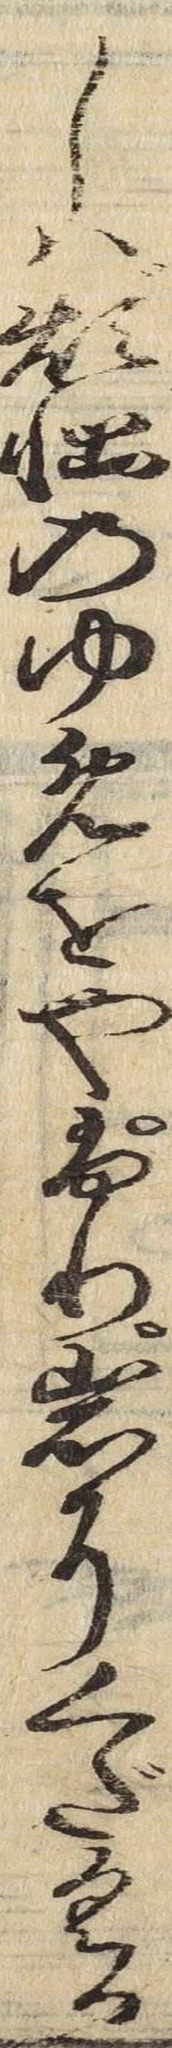しは煩悩のゆめをや。けり。岩にくだくる
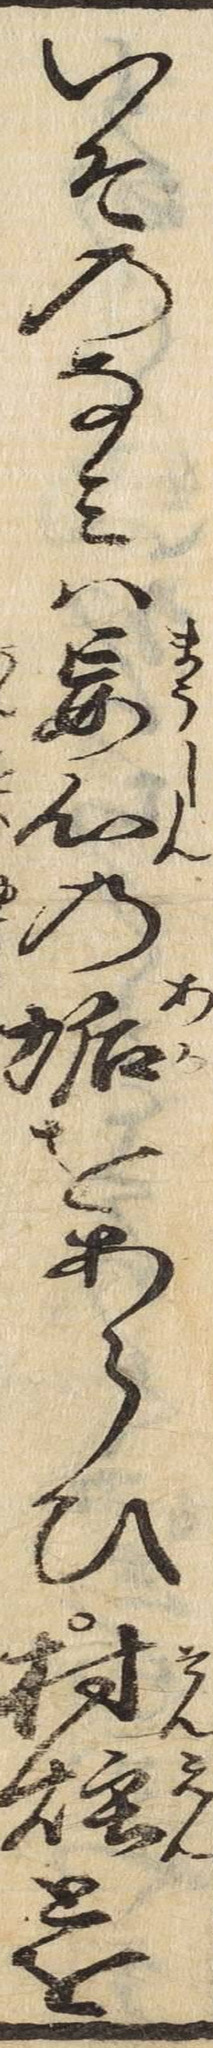いそのなみは妄心の垢をあらひ。村煙とを
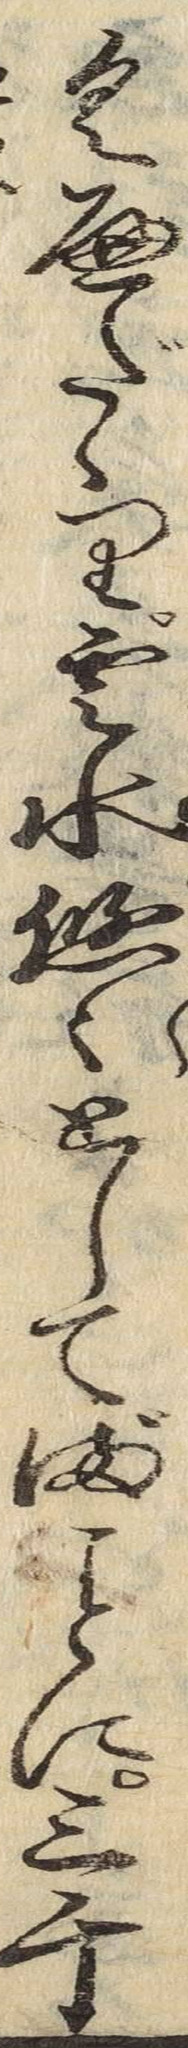くへだゝり。雲水悠々として。まことに。三千
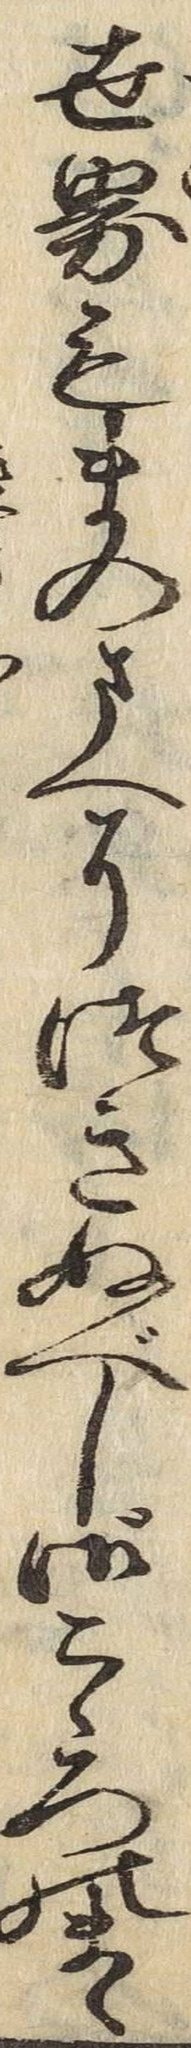世界もまのまへにつきぬべし。御こゝろのまゝ
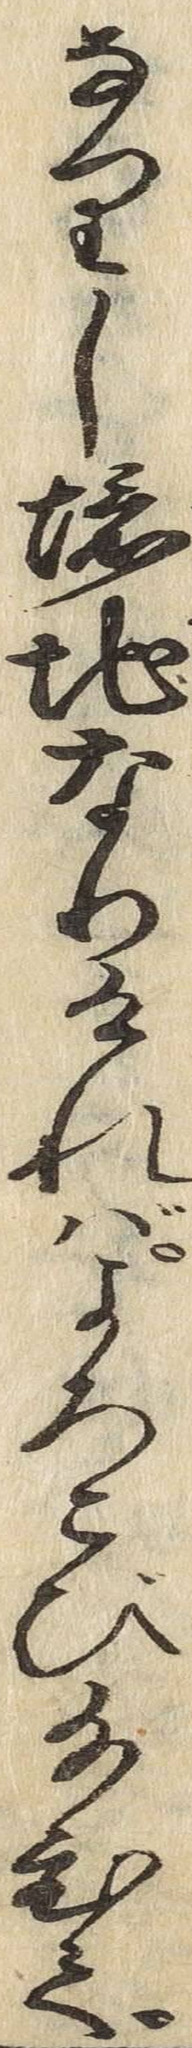なりし境地なりければ。よろこひ給ひて。
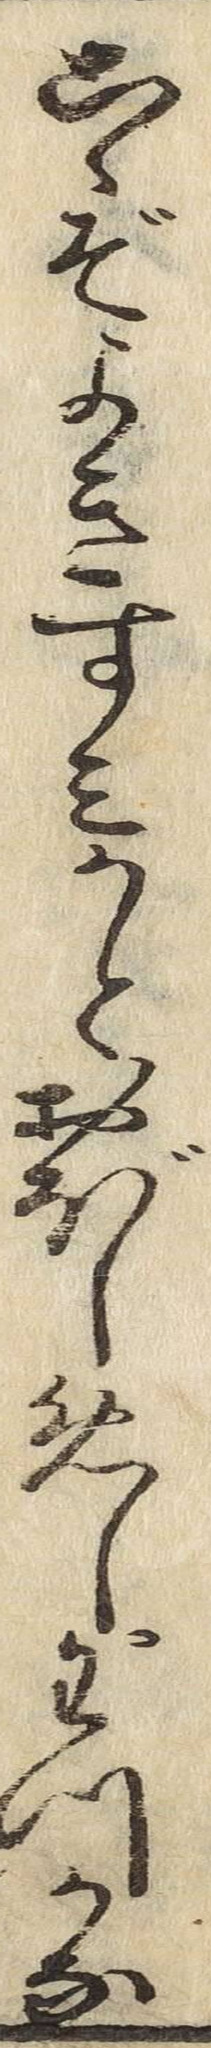こゝぞよきすみかとおぼしめし。わつかな
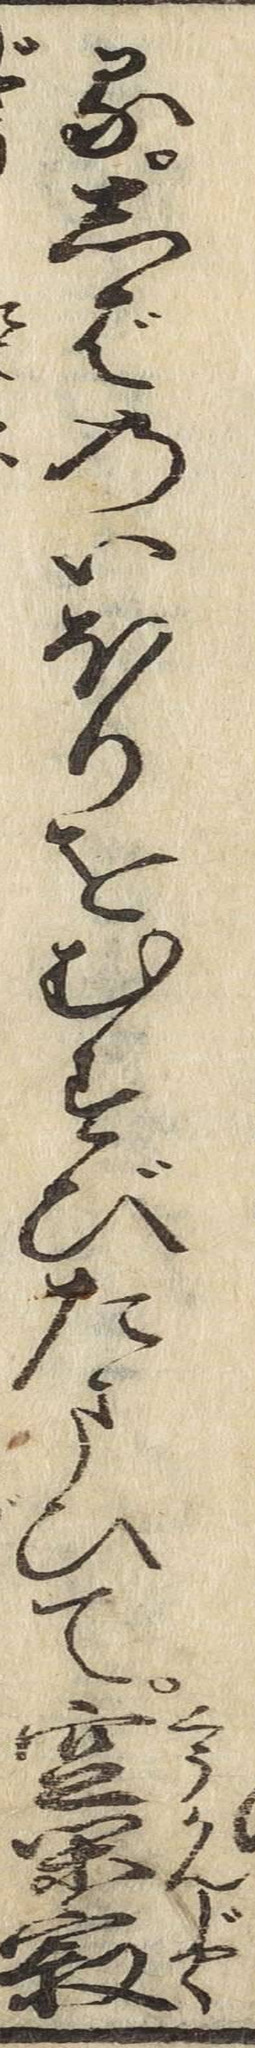る。しばのいほりをむすびたまひて。空閑寂
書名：弘法大師御傳記
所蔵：京都府立京都学・歴彩館 国文学研究資料館
